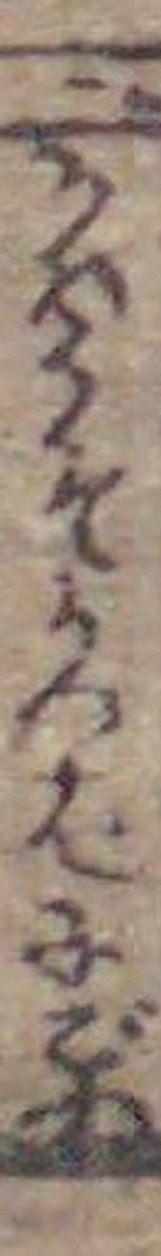かはうそかつはにごゐ
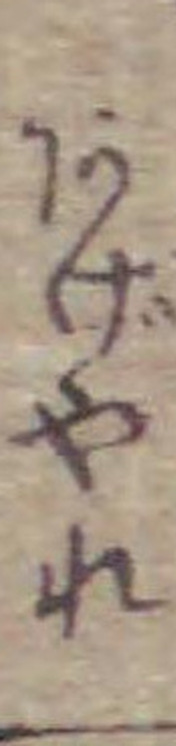あげやれ

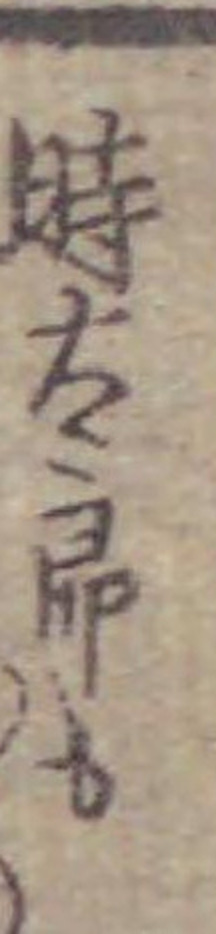時太郎も
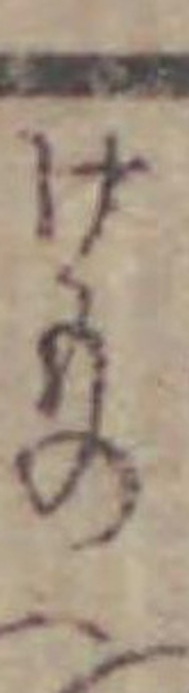けもの
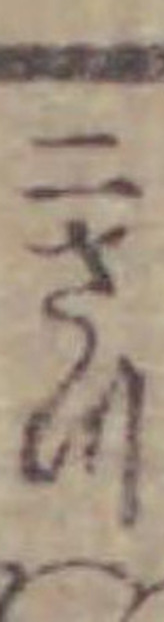二さつ
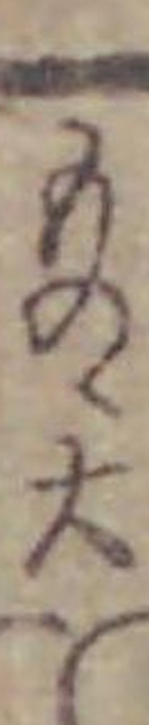ものゝ大
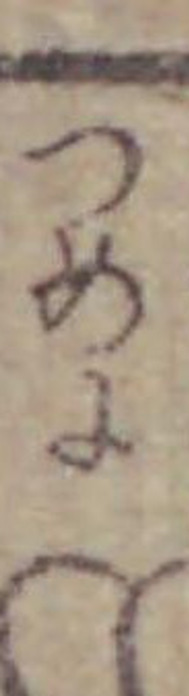つめに
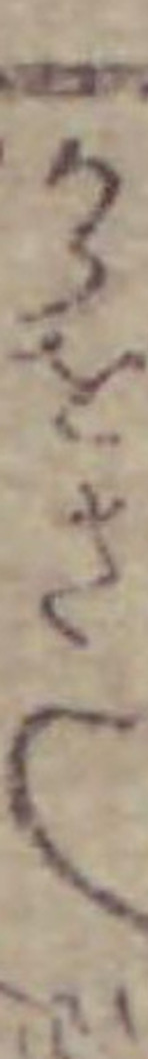からをさ
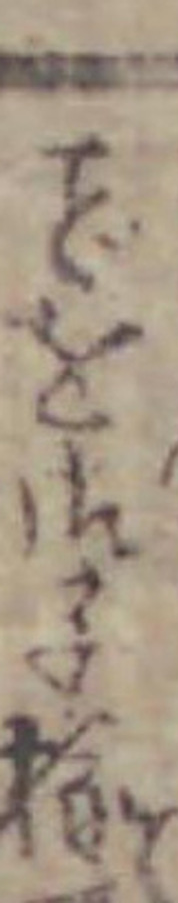ごとを御子様
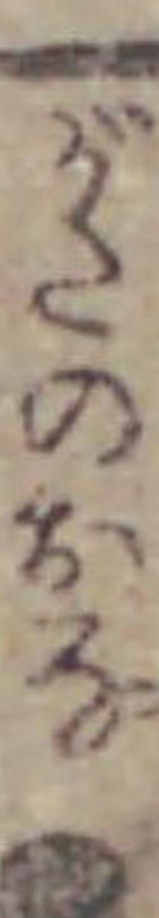がたのおな
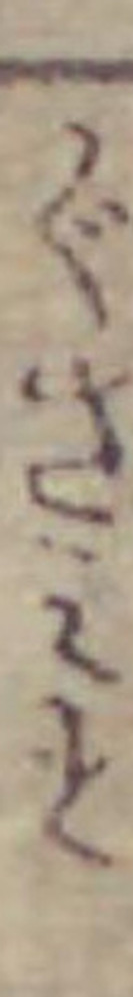ぐさみと
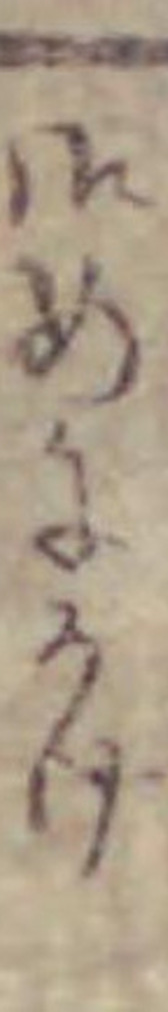御めにかて
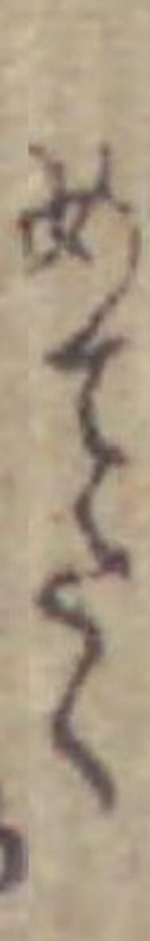めてたく
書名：二日替 : 2巻
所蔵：国立国会図書館 National Diet Library, JAPAN
